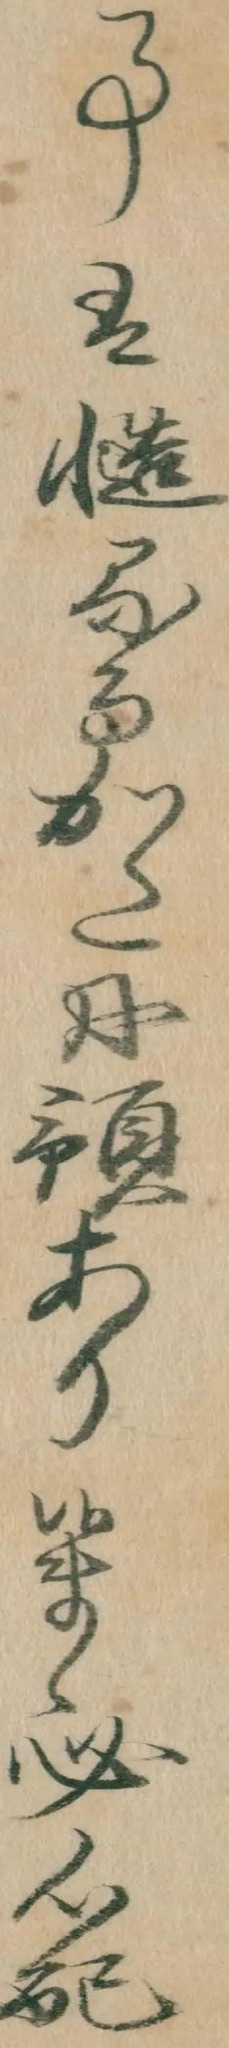事は慥なるかたに預あり候まゝ必心配
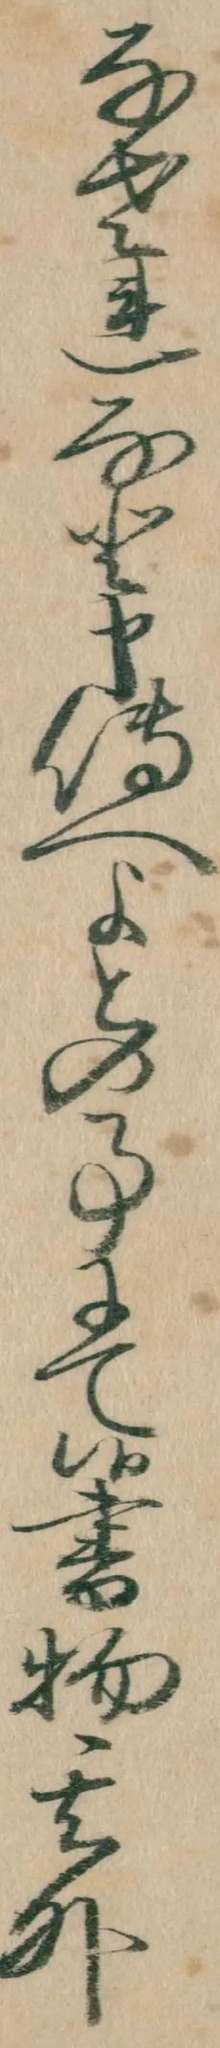なされなと申伝へよとの事にて候書物其外
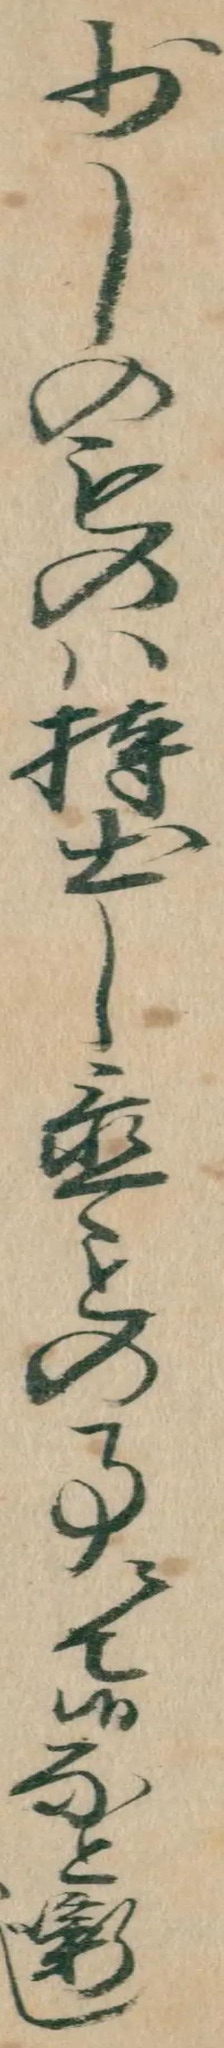少しのものは持出し置候との事にて候なと噺し
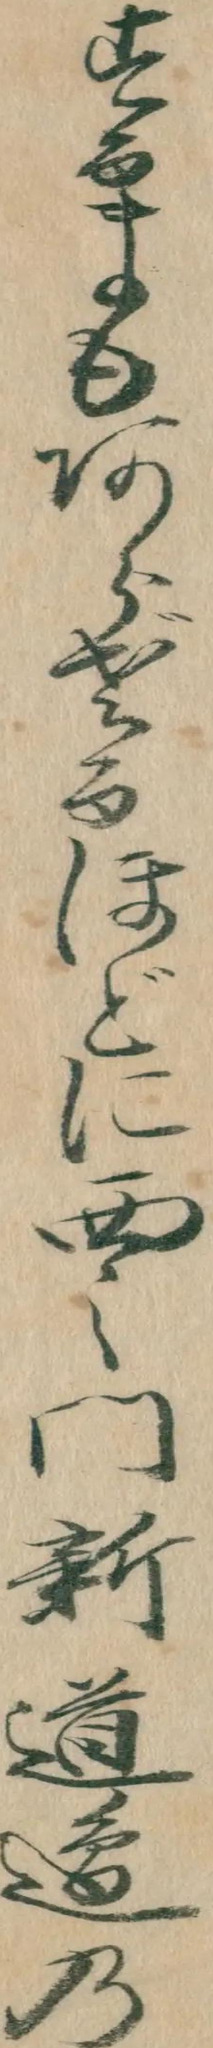するまもあらざるほどに西之門新道辺の
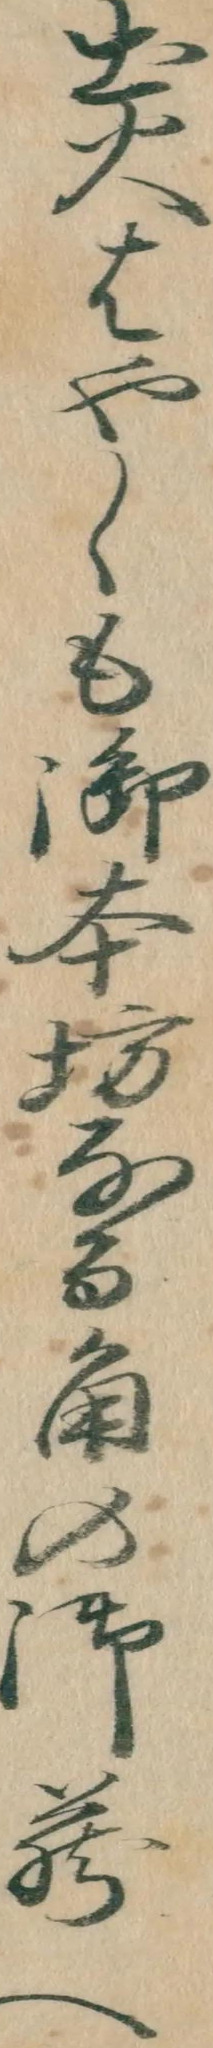出火はやくも御本坊なる角の御蔵へ
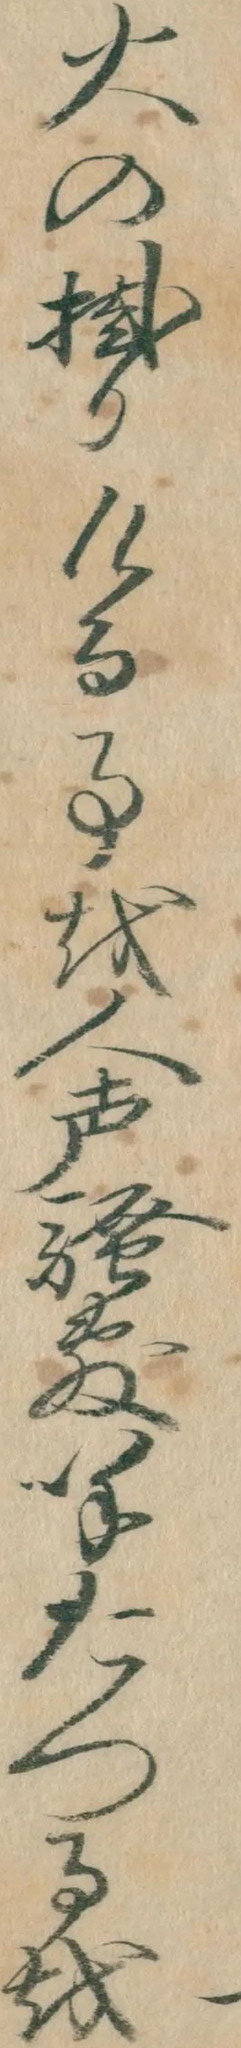火の掛りける事を人声騒敷呼たつるを
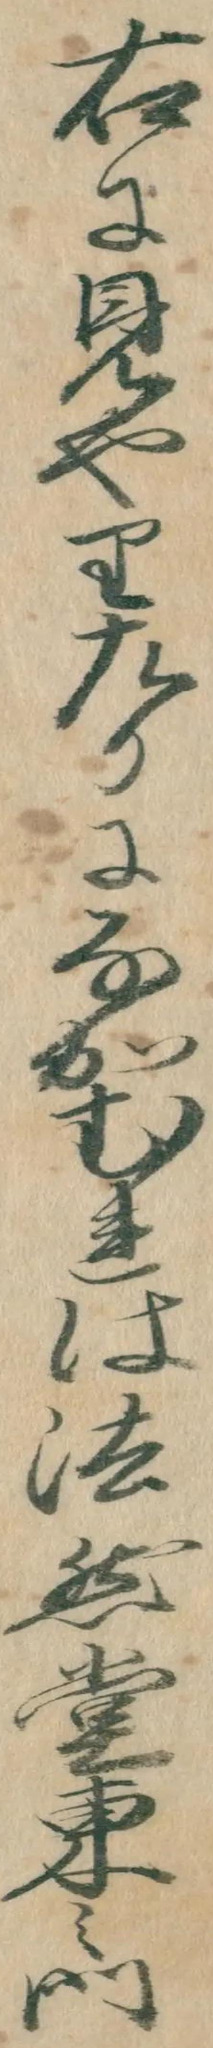右に見やり左りにながむれは法然堂東之門
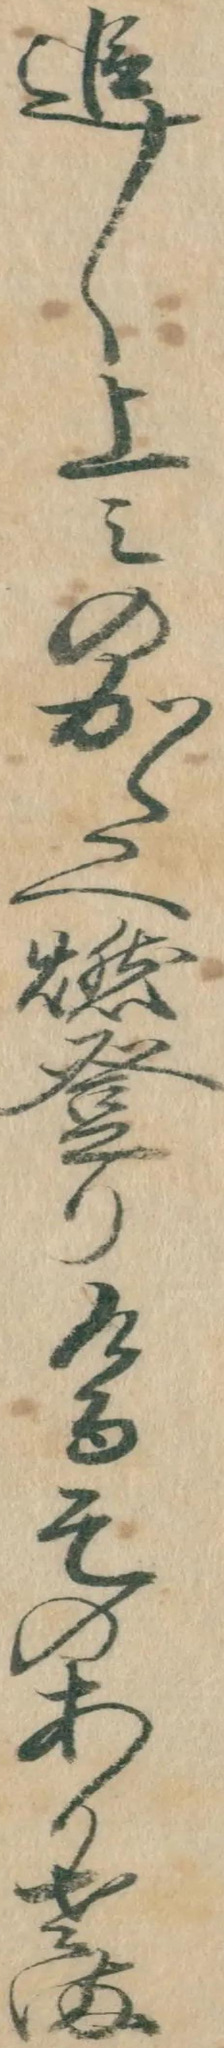追〳〵上みのかたへ燃登りけるそのありさま
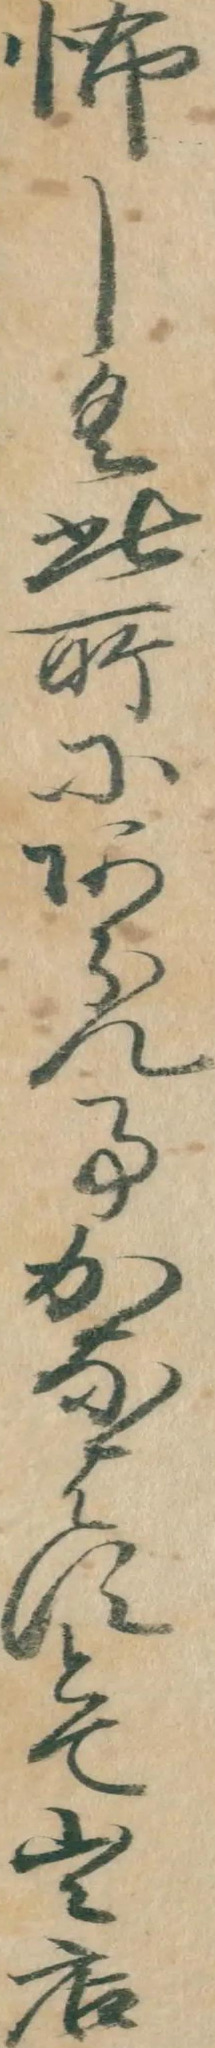怖しく此所にあらん事かなはすとて出店

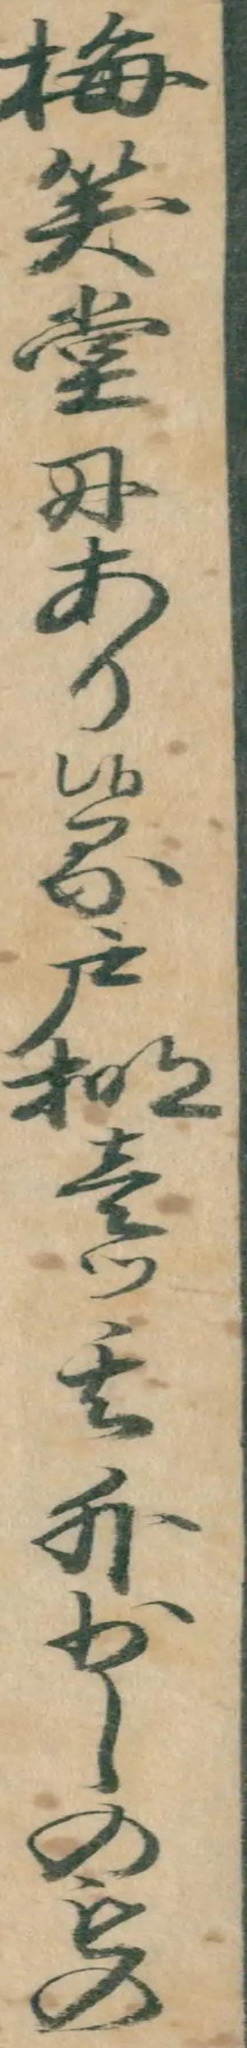梅笑堂にあり候累戸棚壱つ其外かしのもの
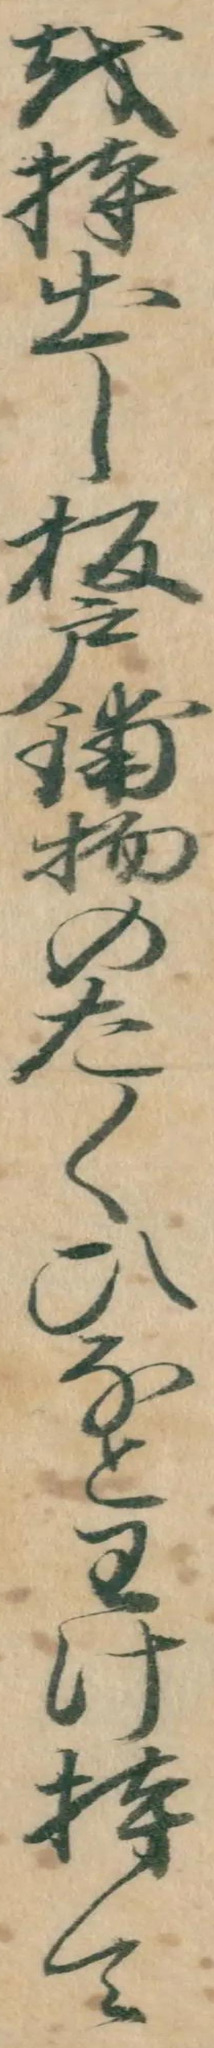を持出し板戸鋪物のたくひなとわけ持て
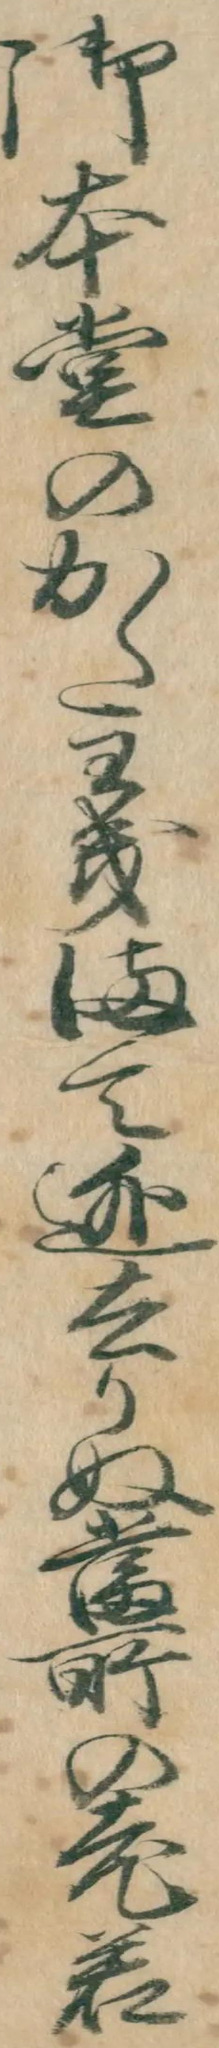御本堂のかたわきまて逃去りぬ当所の老若
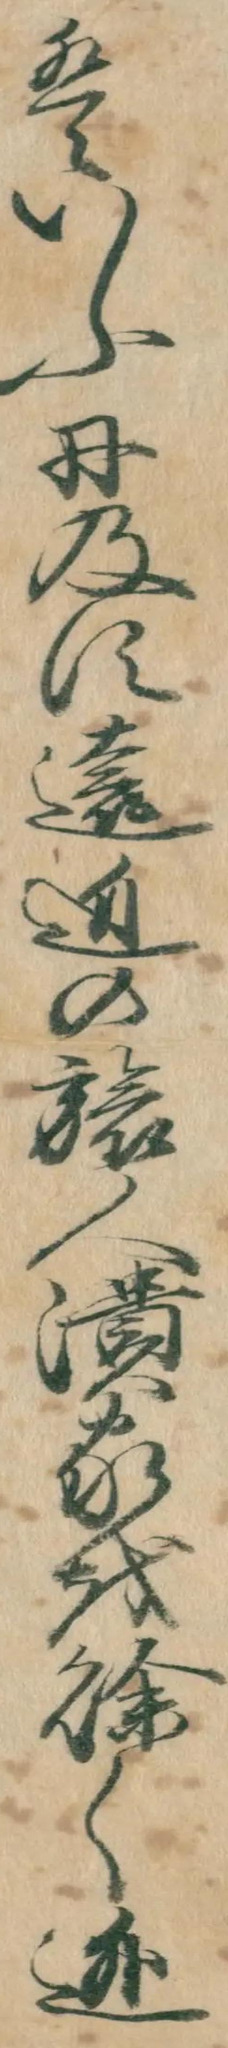はいふに及す遠近の旅人潰家を徐〳〵逃
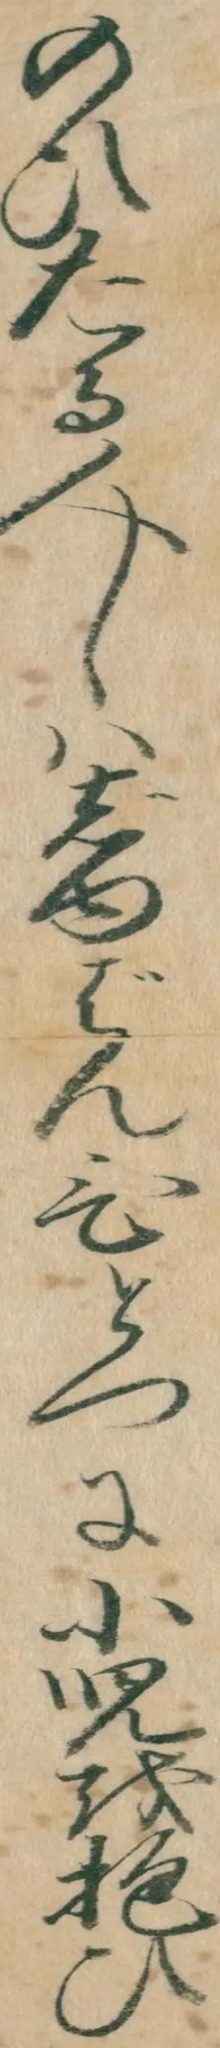のひたる人〳〵はじゆばんひとつに小児を抱ひ
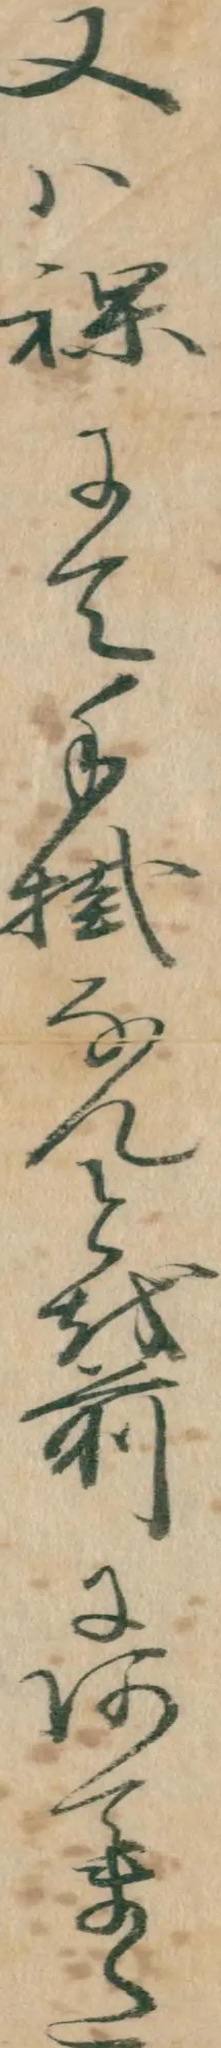又は裸にて手拭なんとを前にあてまた
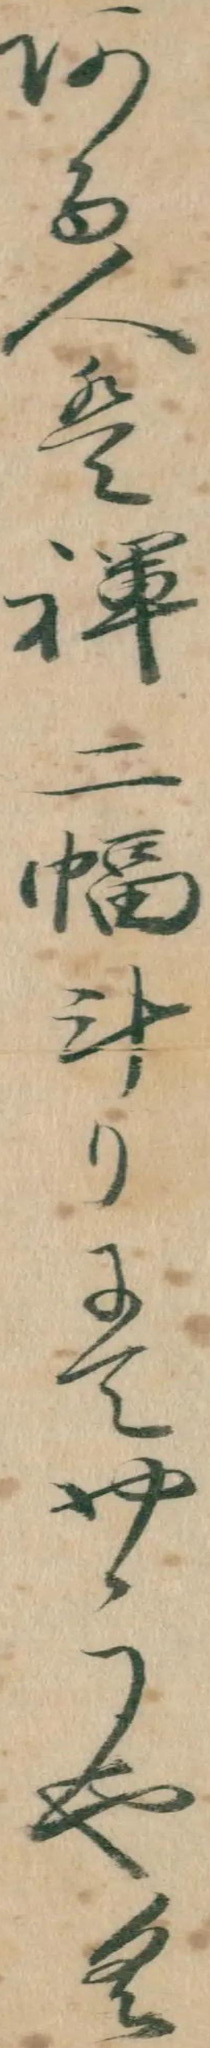ある人は褌二幅斗りにてやうやく
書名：俗語之種. [3]
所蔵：国立国会図書館 National Diet Library, JAPAN
